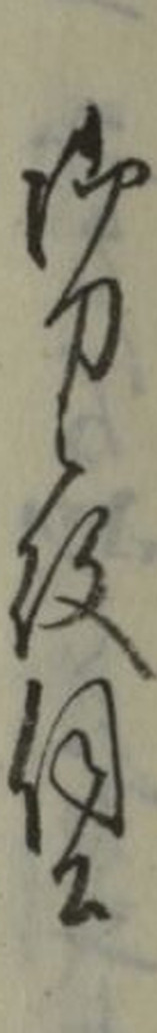御刀之役伺候
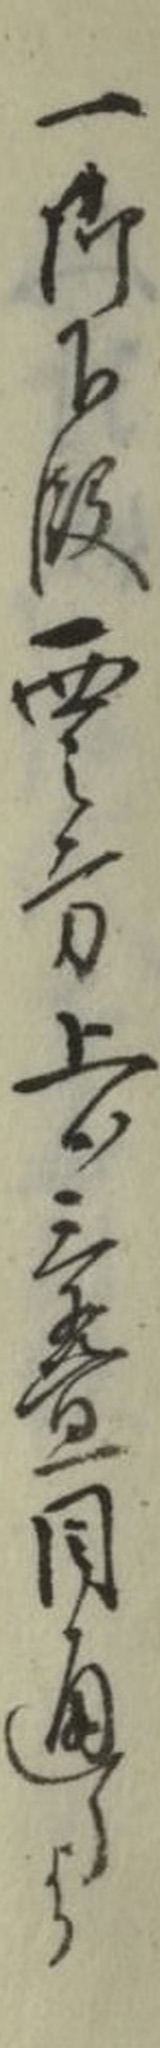一御下段西之方上ゟ三畳目通りより
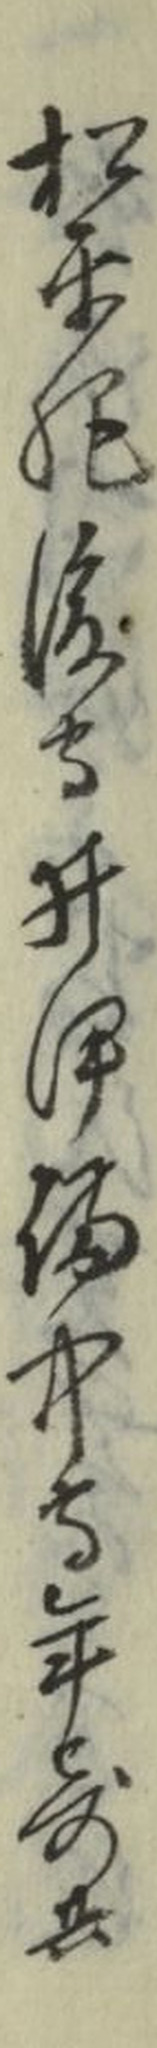松平肥後守井伊備中守年寄共
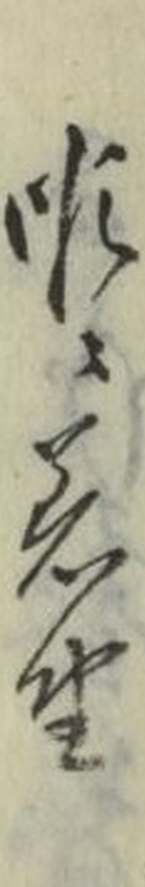順に着坐
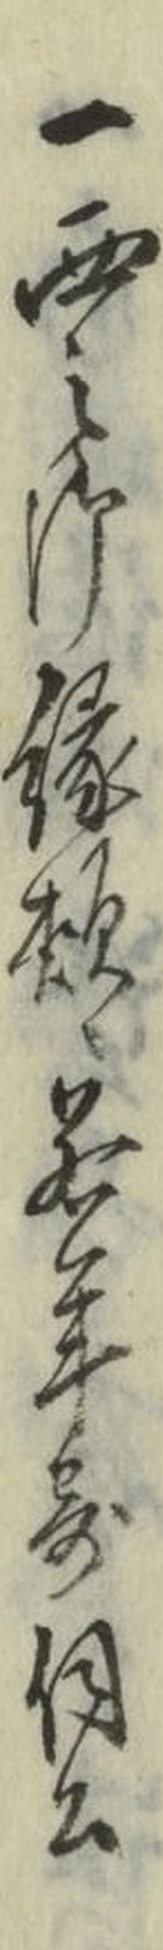一西之御縁頬に若年寄伺候
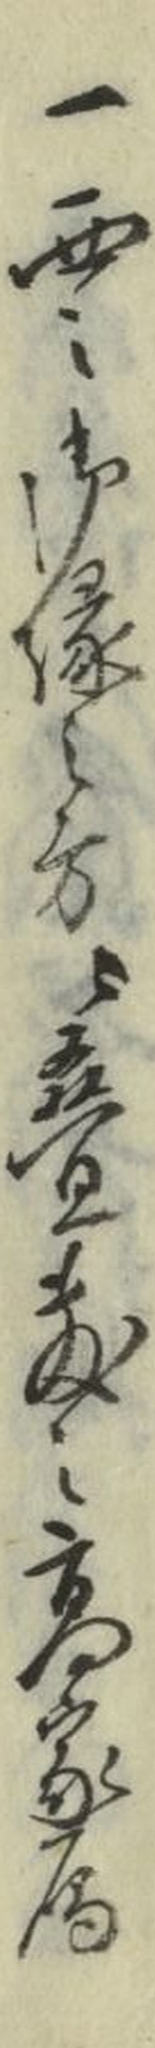一西之縁之方に畳敷之高家雁

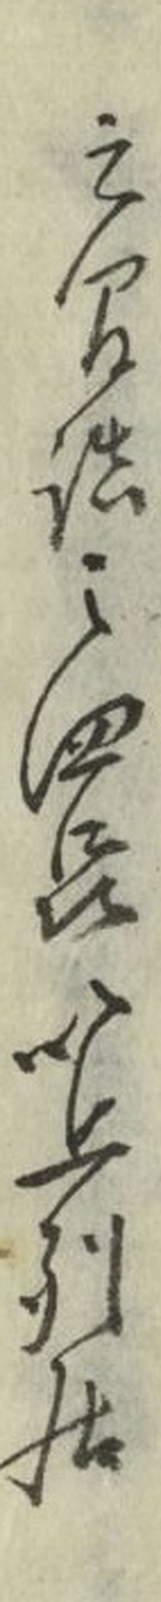之間詰之四品以上列居
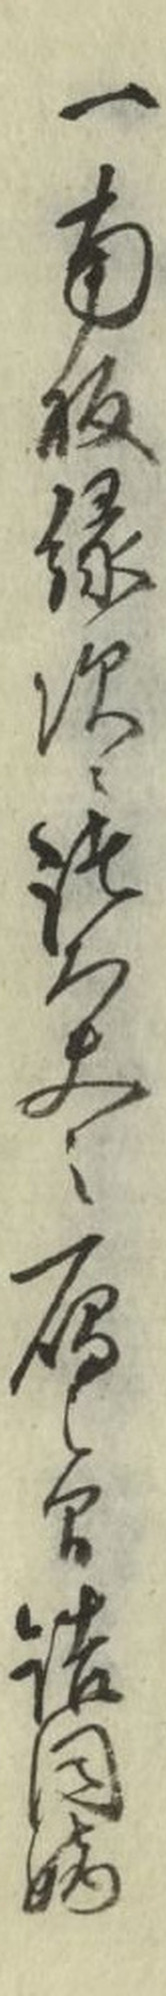一南板縁次に諸大夫之雁之間詰同嫡
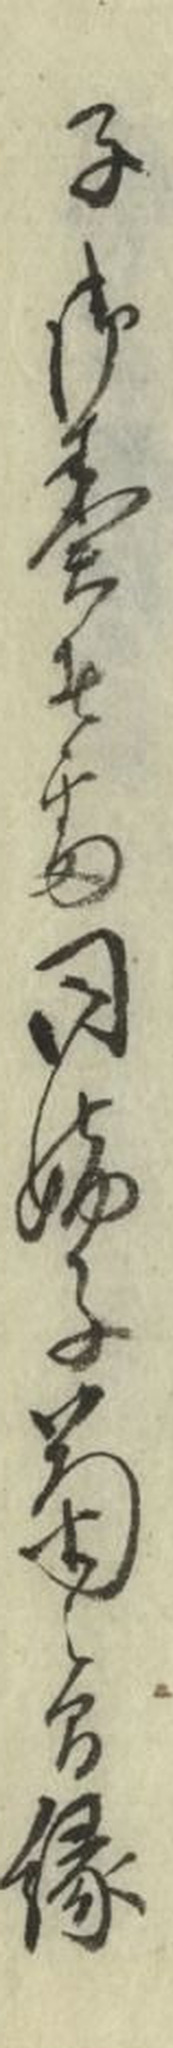子御奏者番同嫡子菊之間縁
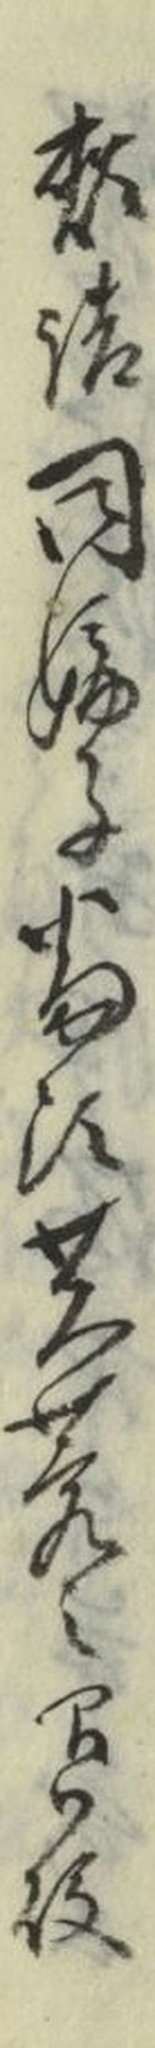頬詰同嫡子番頭芙蓉之間御役
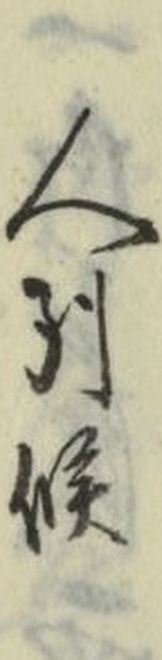人列候
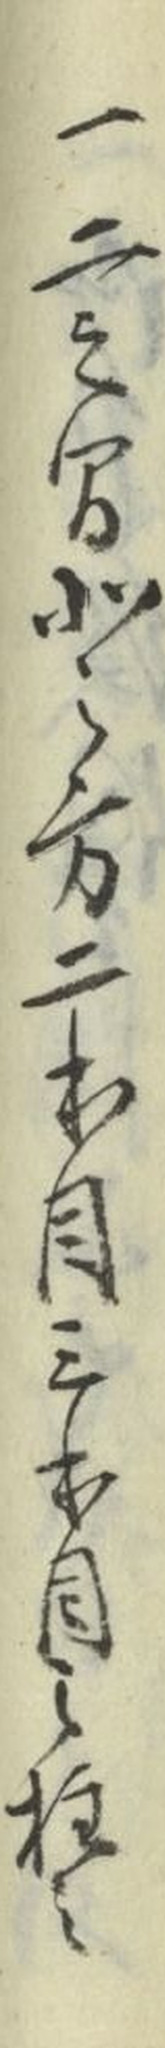一二之間北之方二本目三本目之柱之
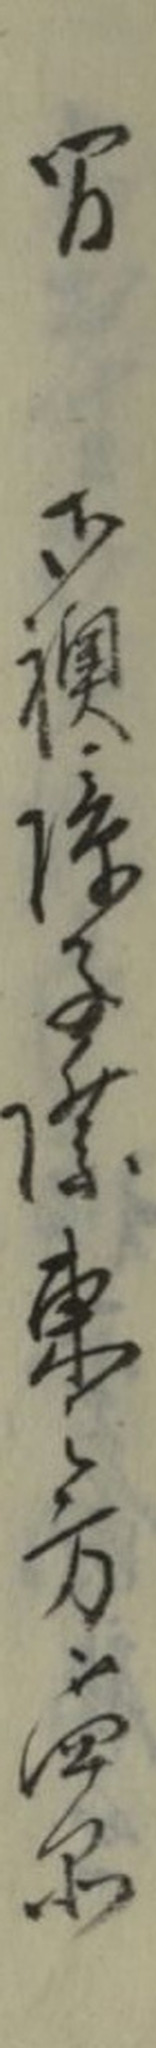間御襖障子際東之方に四品
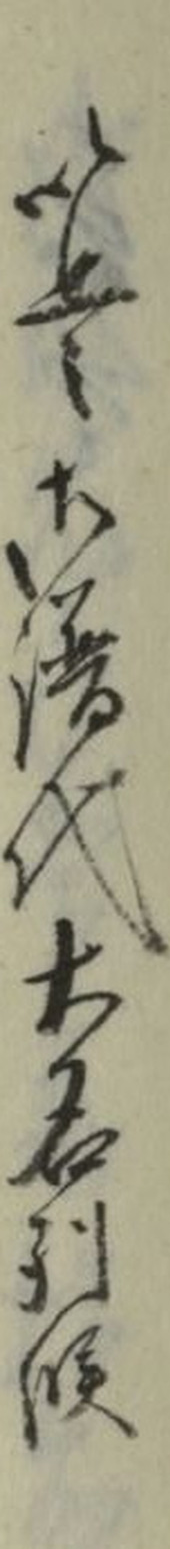以上之御譜代大名列候
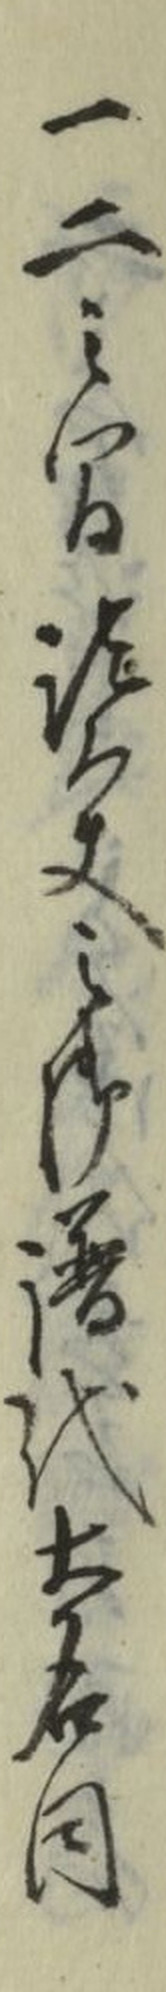一二之間諸大夫之御譜代大名同
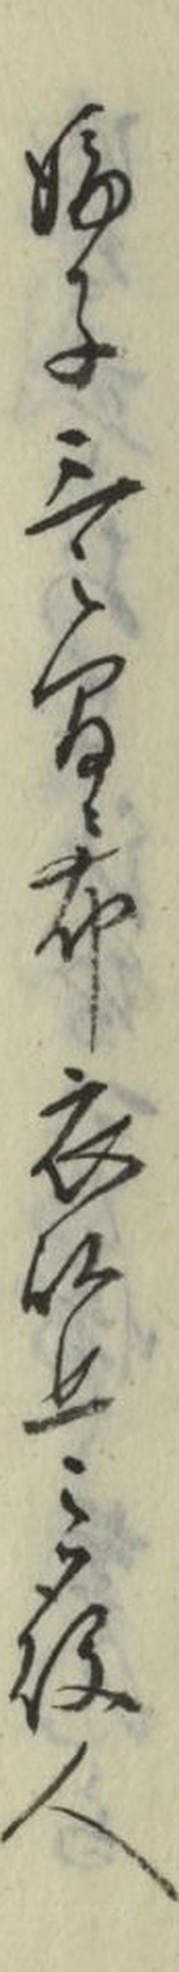嫡子三之間に布衣以上之御役人
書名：琉球人来朝記 一之二
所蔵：University of the Ryukyus Library
